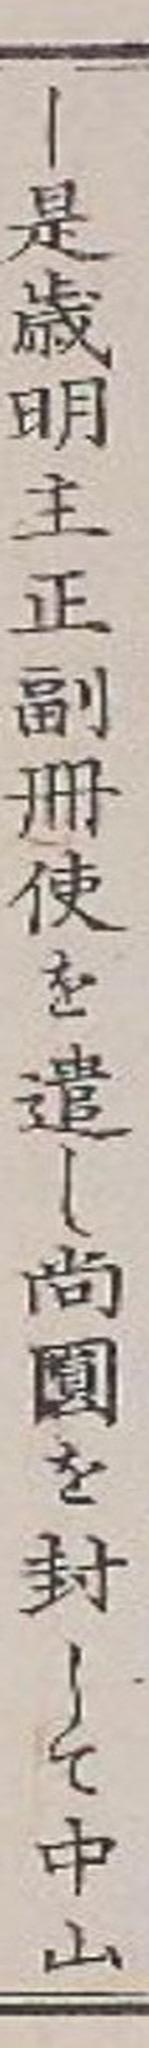し是歳明主正副冊使を遣し尚円を封して中山
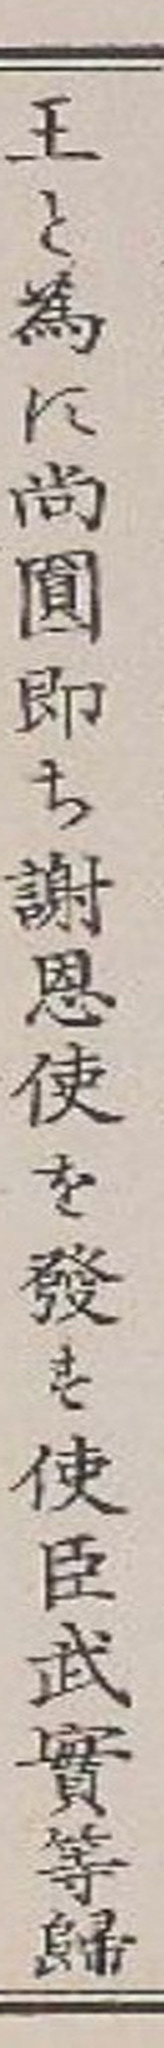王と為す尚円即ち謝恩使を発す使臣武実等帰
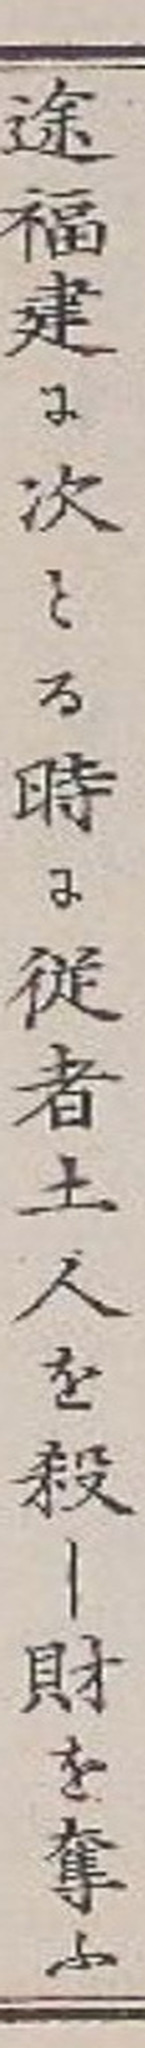途福建に次とる時に従者土人を殺し財を奪ふ
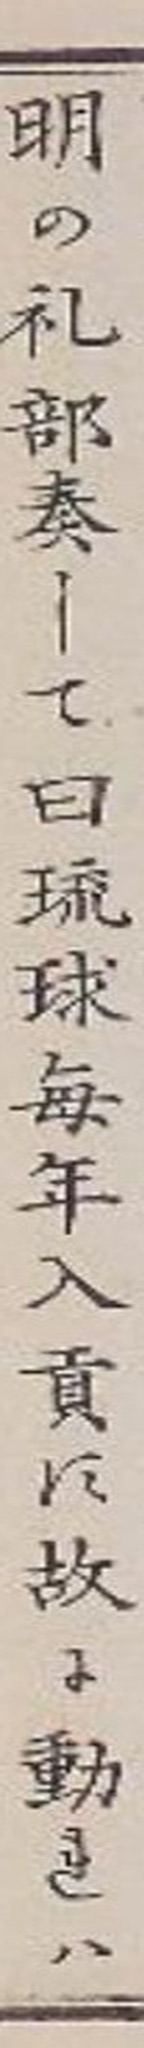明の礼部奏して曰琉球毎年入貢す故に動れは
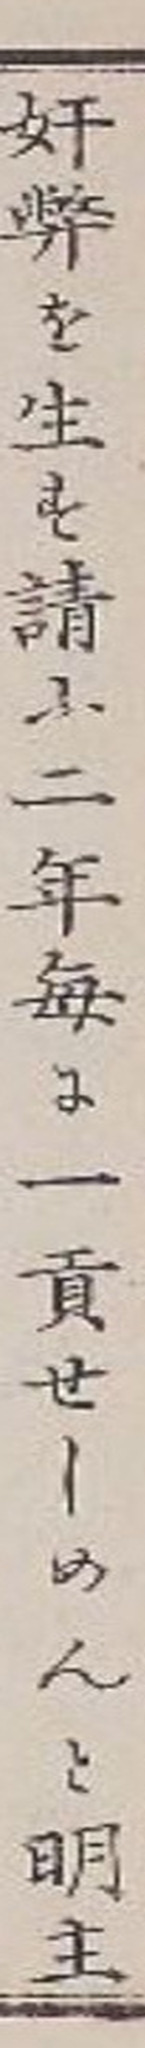奸弊を生す請ふ二年毎に一貢せしめんと明主
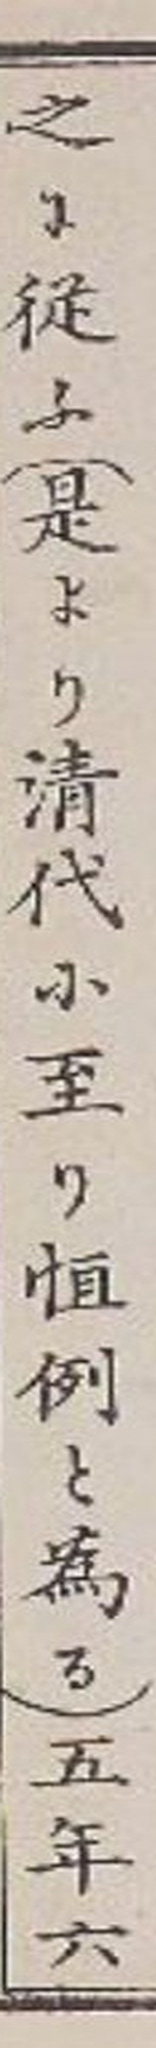之に従う(是より清代に至り恒例と為る)五年六
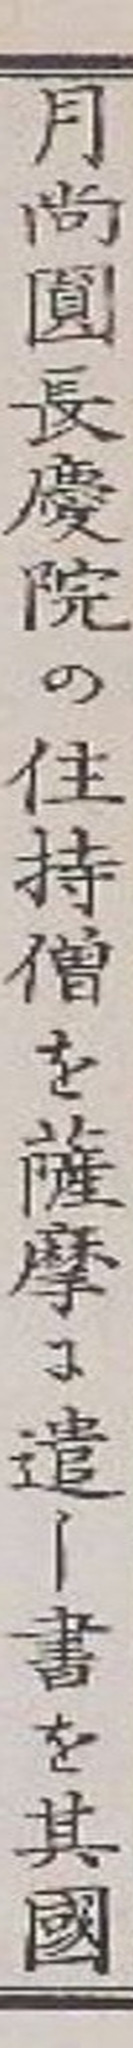月尚円長慶院の住持僧を薩摩に遣し書を其国
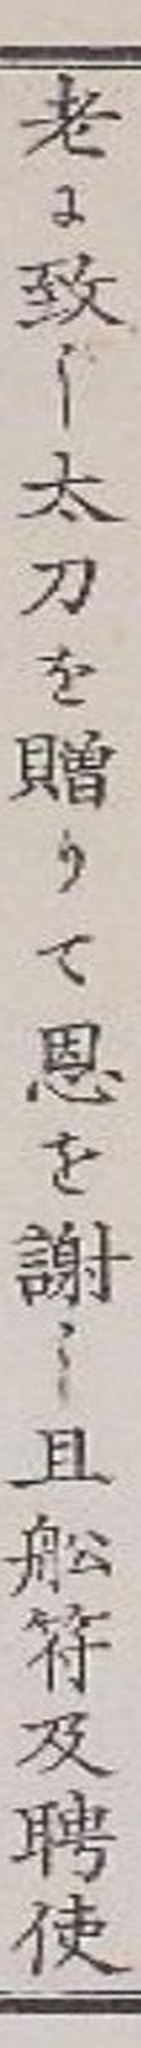老に致し太刀を贈りて恩を謝し且船符及聘使
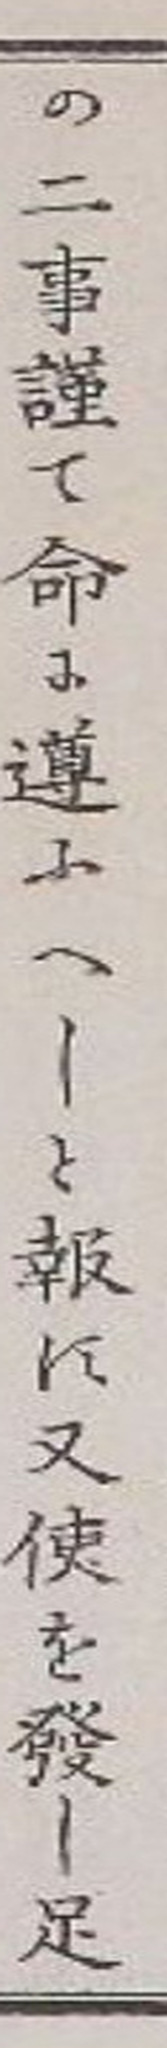の二事謹て命に遵ふへしと報す又使を発し足
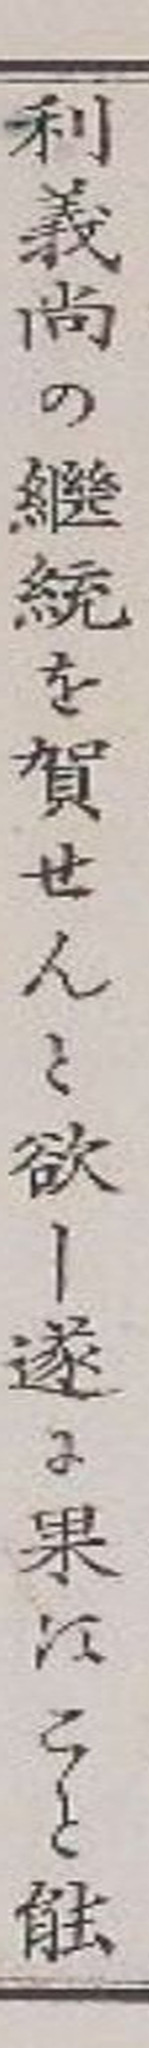利義尚の継統を賀せんと欲し遂に果すこと能
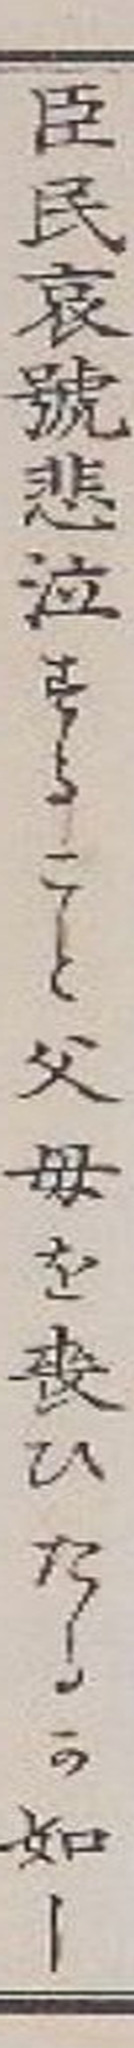臣民哀号悲泣すること父母を喪ひたるか如し
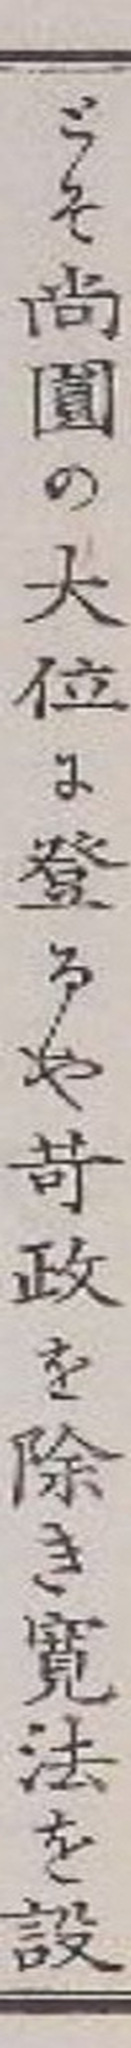とそ尚円の大位に登るや苛政を除き寛政を設
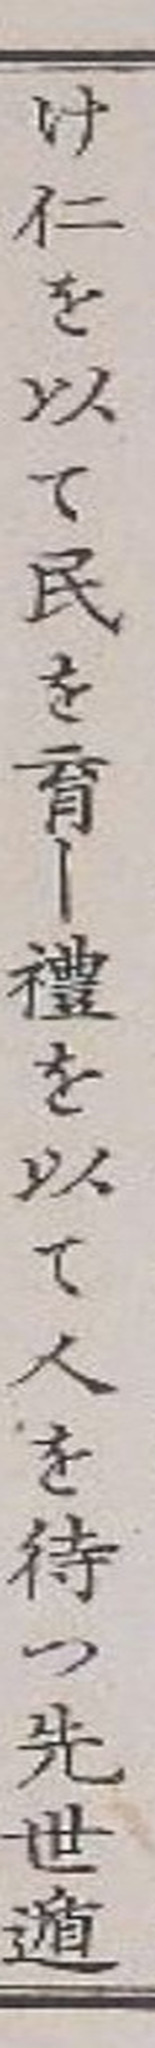け仁を以て民を育し礼を以て人を待つ先世遁
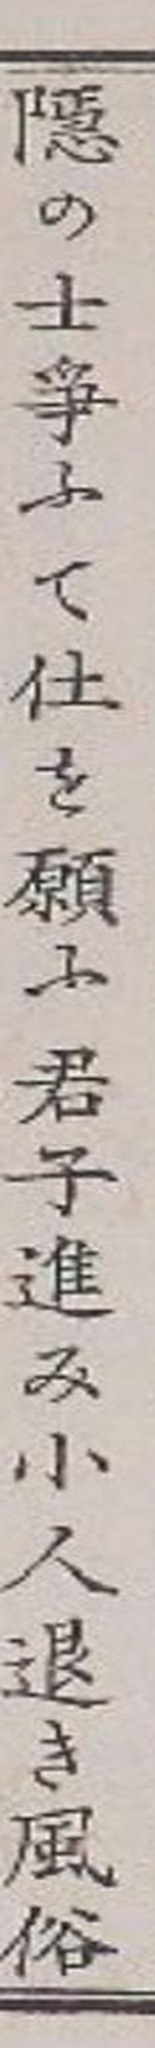隠の士争ふて仕を願ふ君子進み小人退き風俗
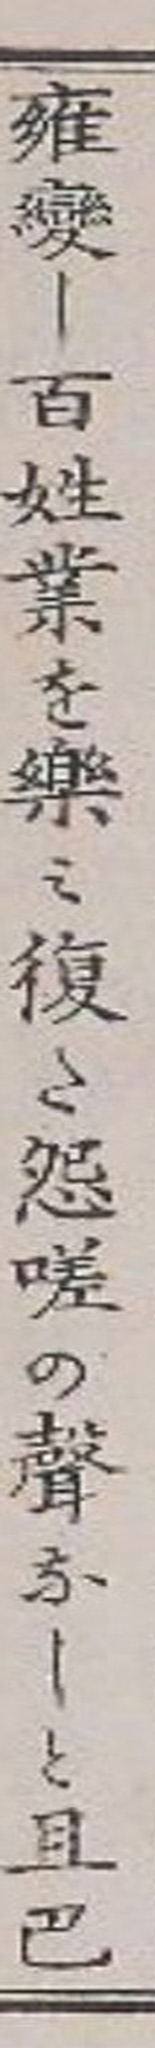雍変し百姓業を楽み復た怨嗟の声なしと且巴

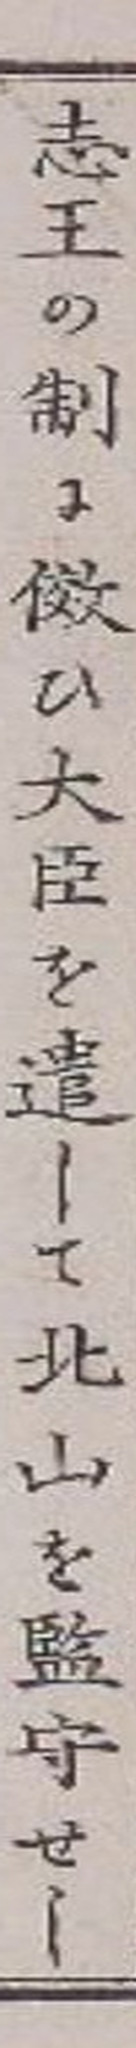志王の制に倣ひ大臣を遣して北山を監守せし
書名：南島紀事 中
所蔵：University of the Ryukyus Library
